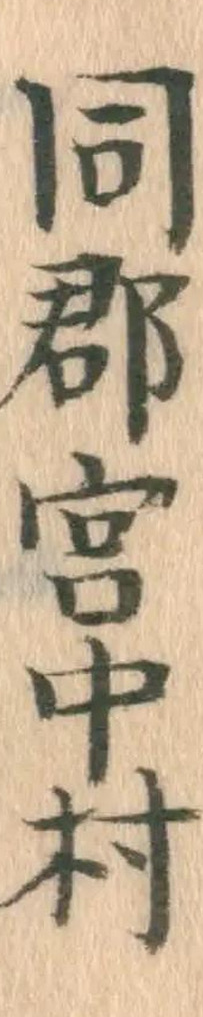同郡宮中村
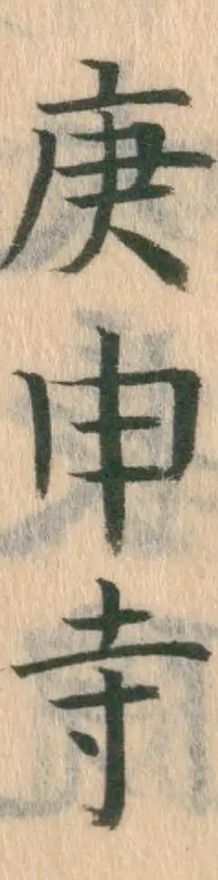庚申寺
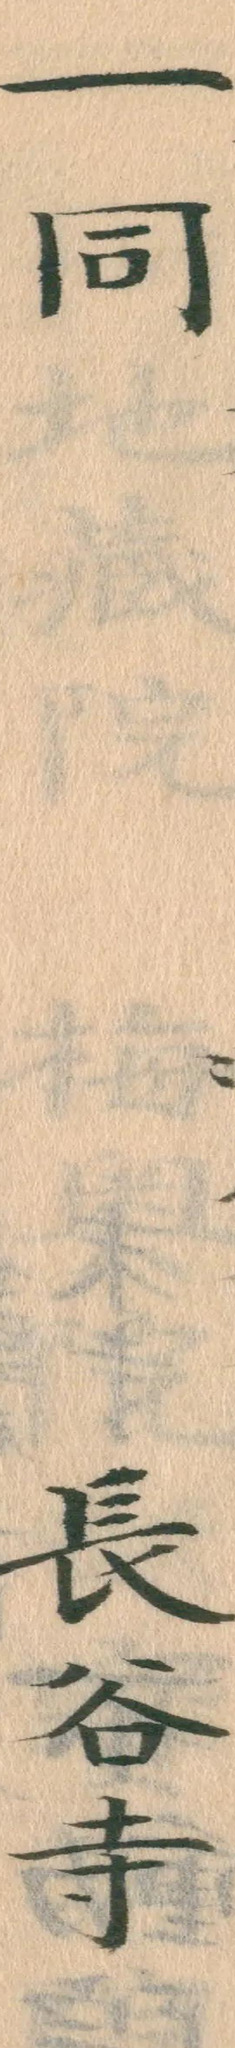一同長国寺
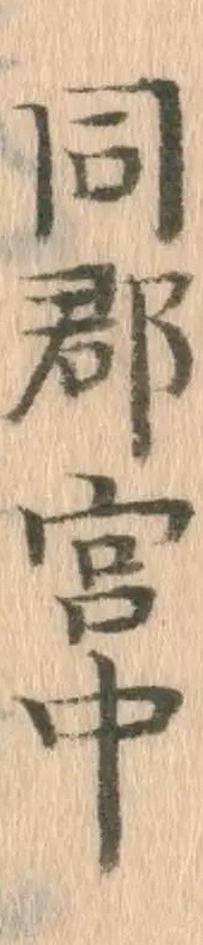同郡宮中
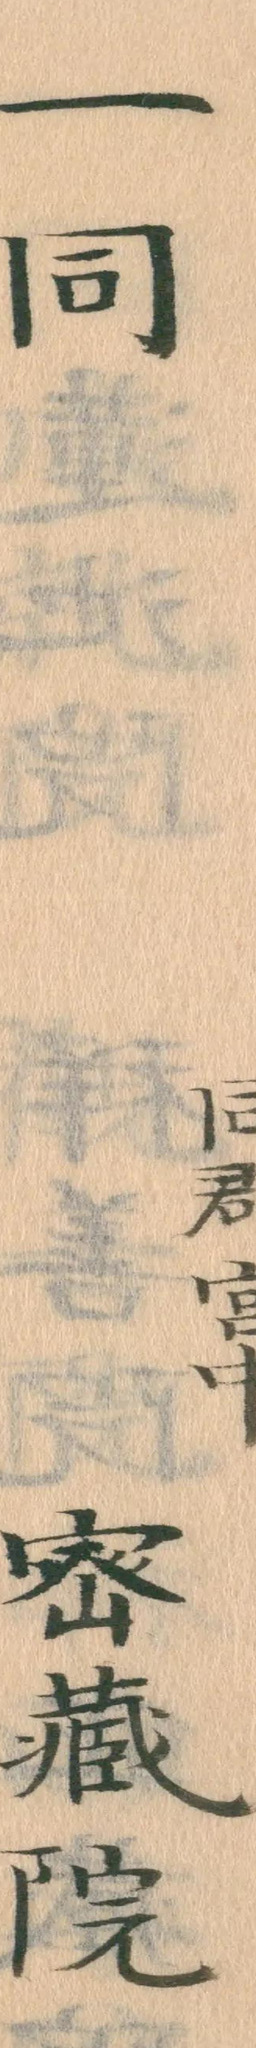一同密蔵院
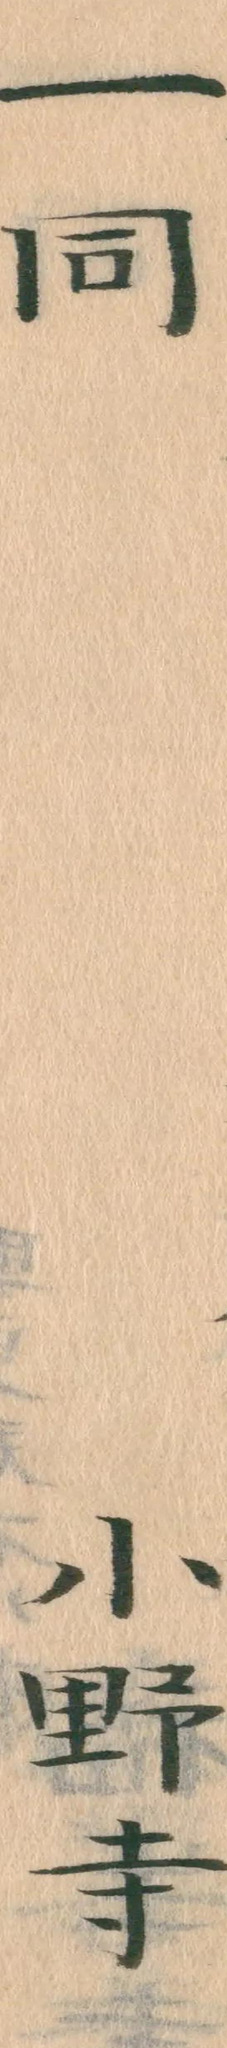一同小野寺
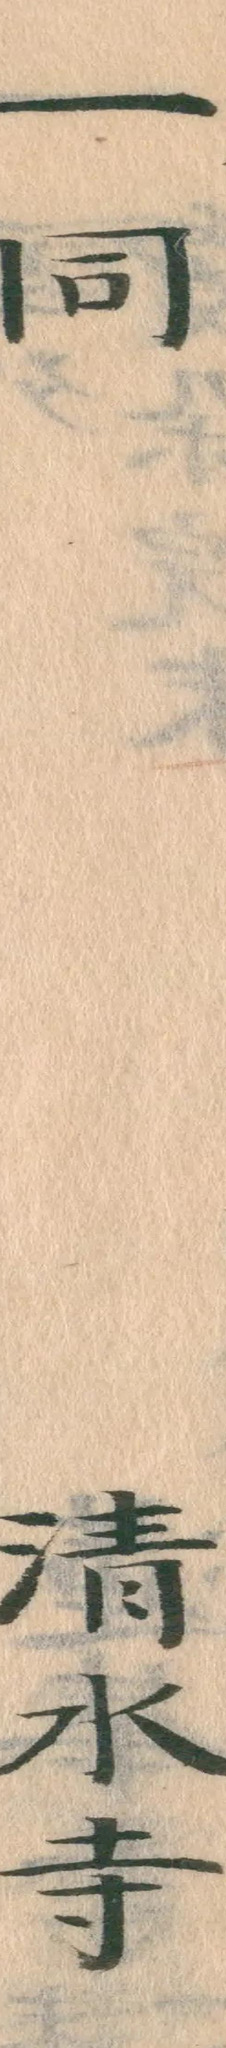一同清水寺
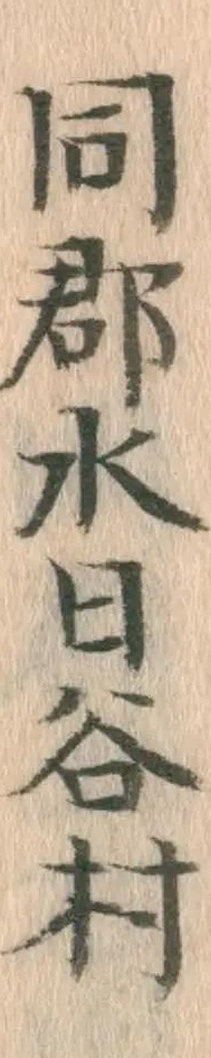同郡水日谷村
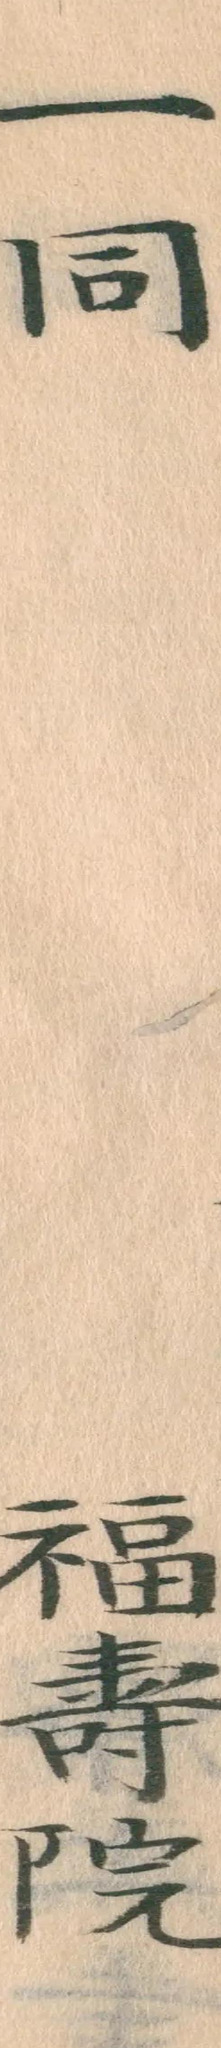一同福寿院
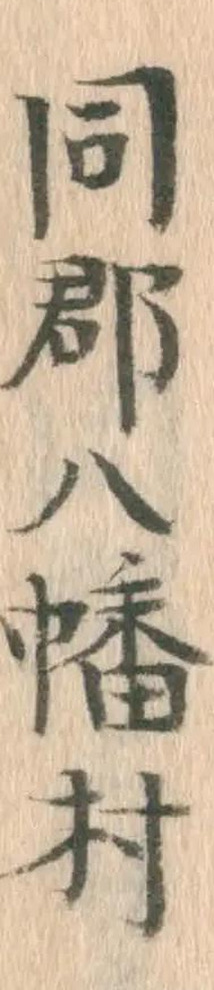同郡八幡村

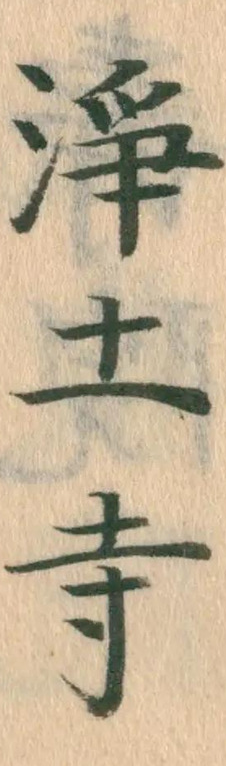浄土寺
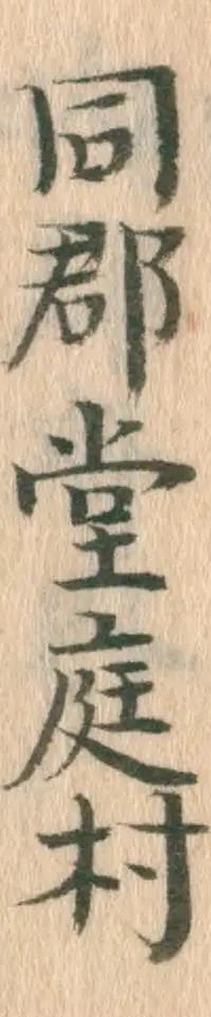同郡堂庭村
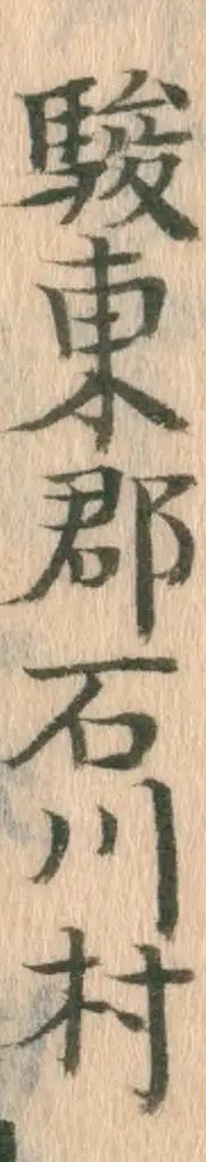駿東郡石川村
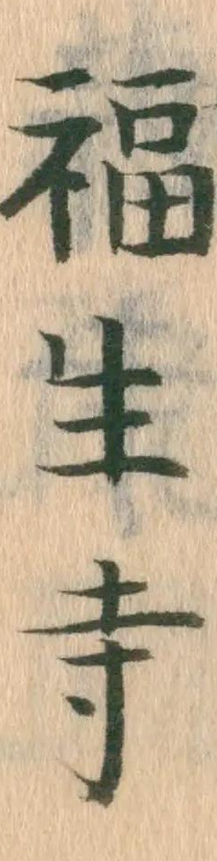福生寺
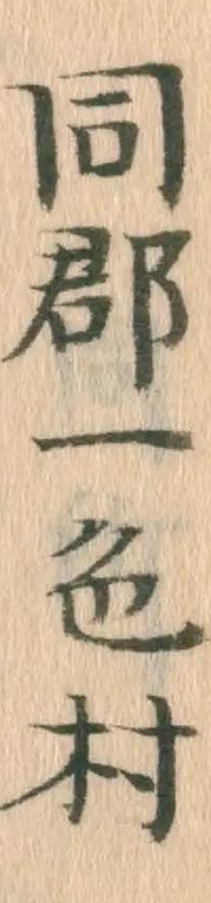同郡一色村
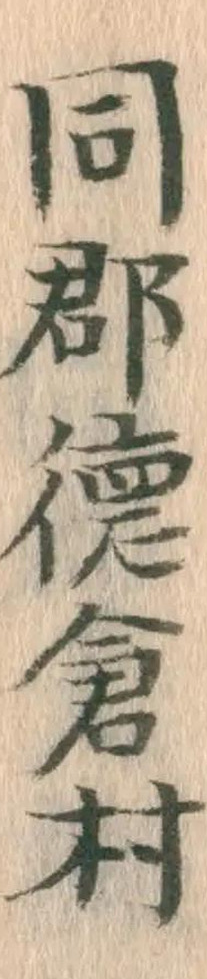同郡徳倉村
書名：古義真言宗本末帳 21巻. [4] 第三 伊賀国、伊勢国、志摩国、尾張国、三河国、遠江国、駿河国、伊豆国、甲斐国
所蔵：国立国会図書館 National Diet Library, JAPAN
